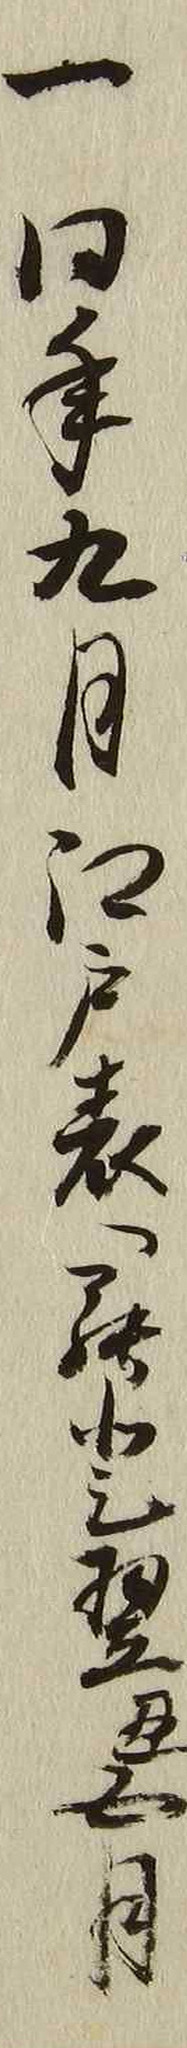一同年九月江戸表へ罷登翌丑五月
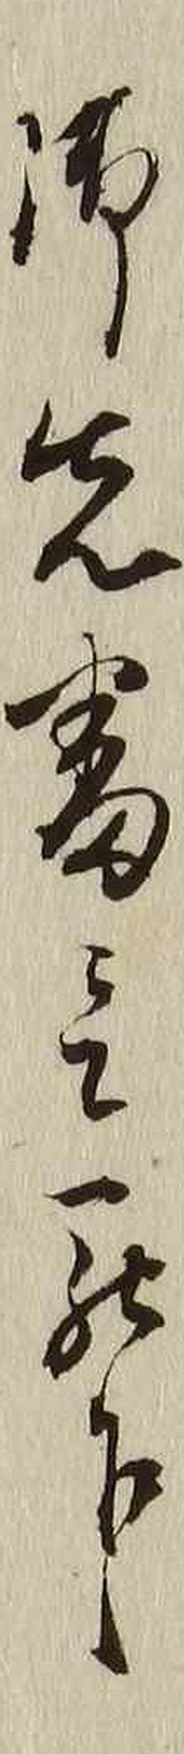御先番ニて罷下候
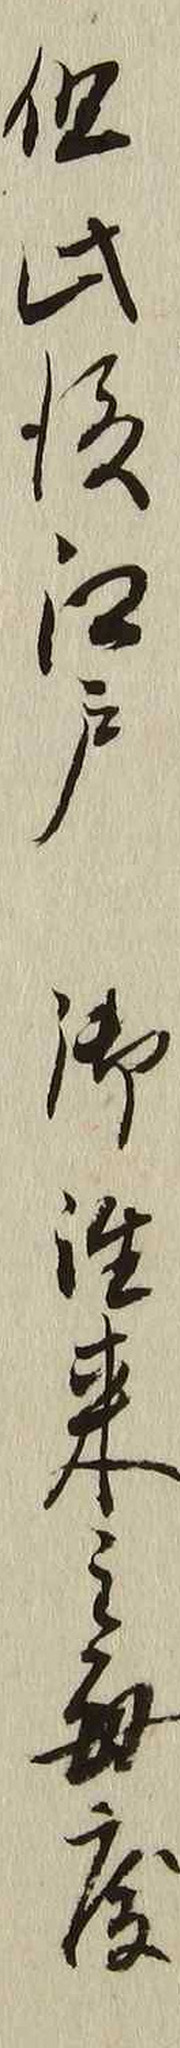但此後江戸御往来之毎度
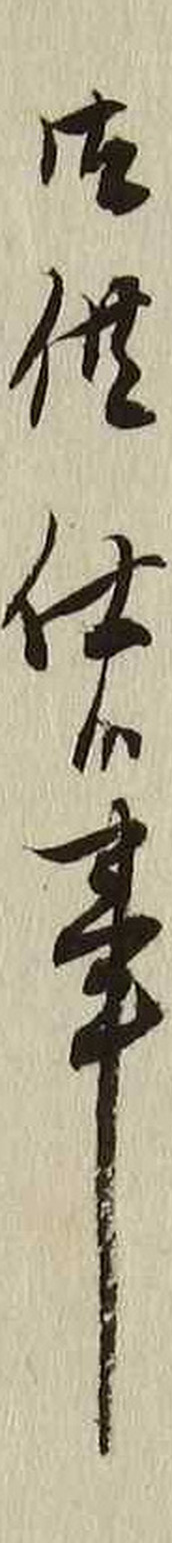御供仕候事
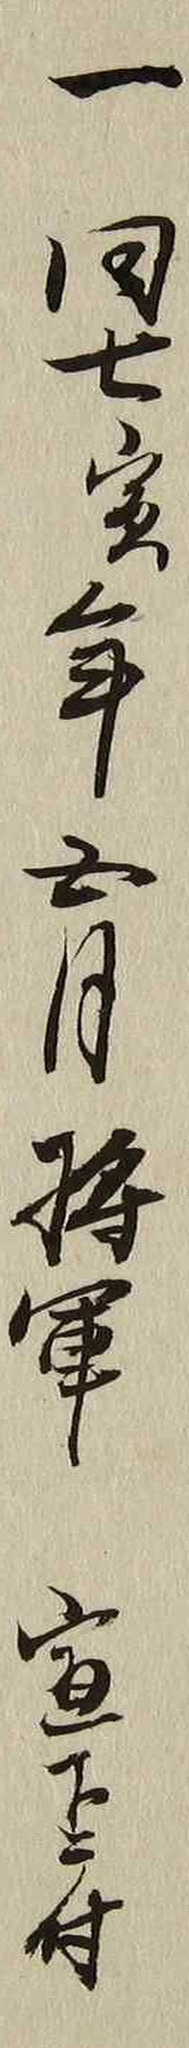一同七寅年五月将軍宣下ニ付
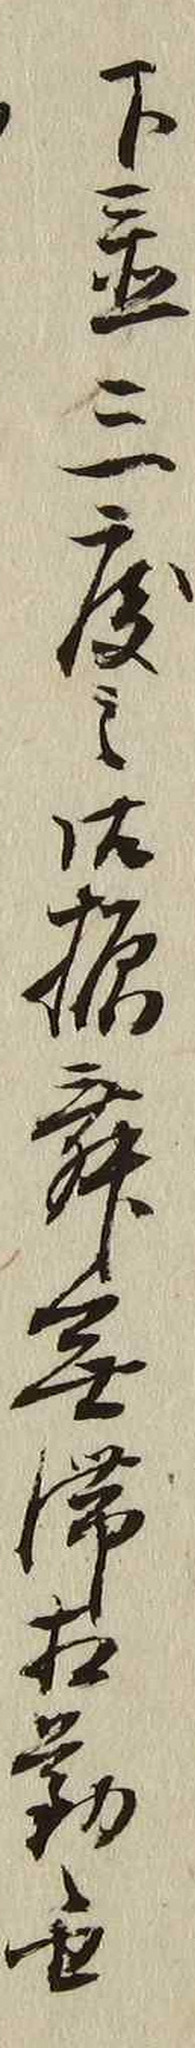下置三度之御振舞無滞相勤候由
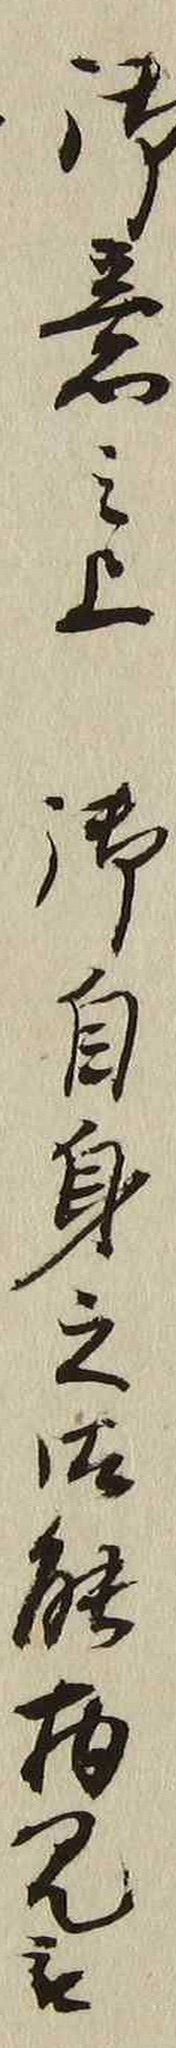御意之上御自身之御能拝見被
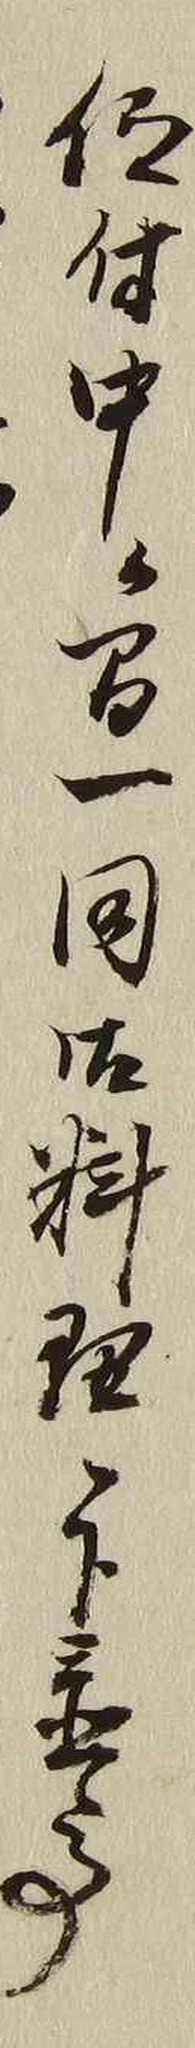仰付中ケ間一同御料理被下置候事
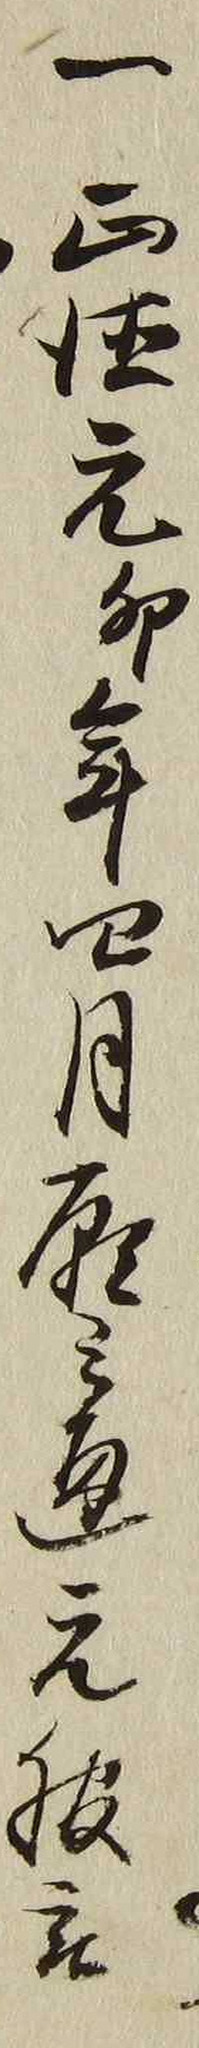一正徳元卯年四月願之通元服被
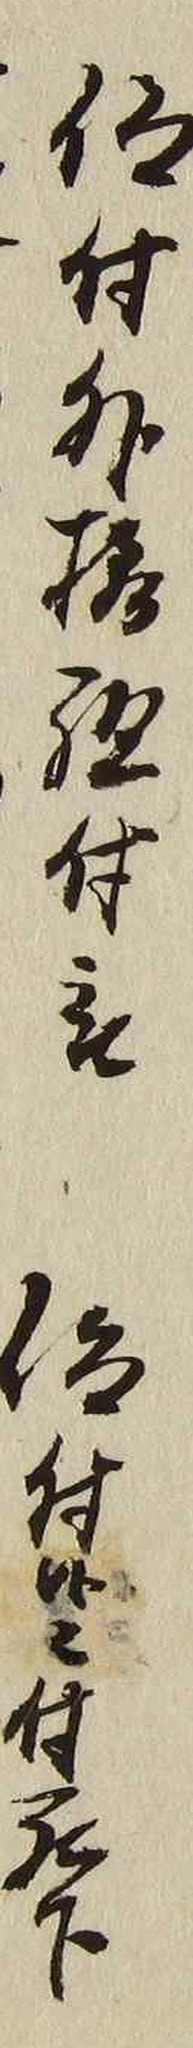仰付外様組付被仰付候ニ付罷下
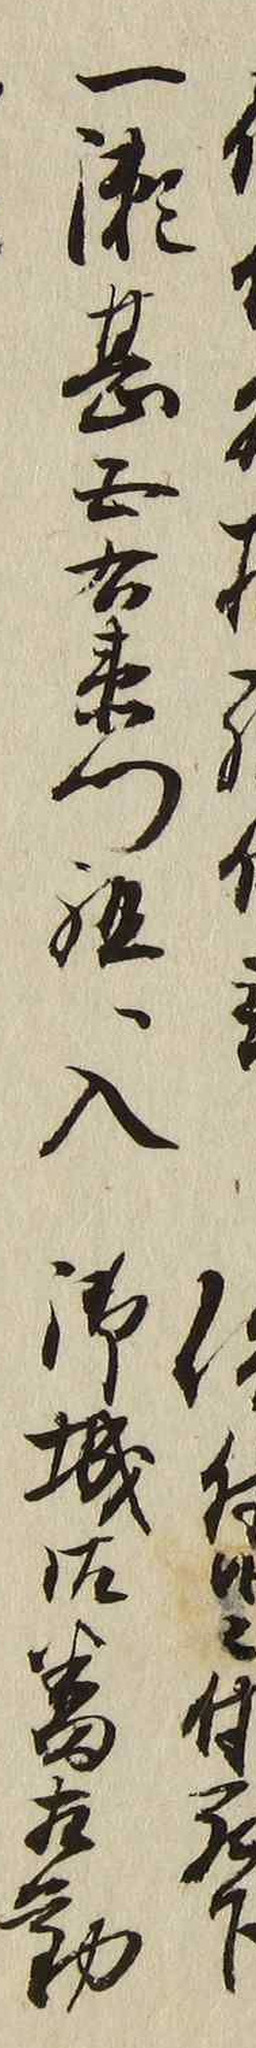一瀬甚五右衛門組へ入御城御番相勤
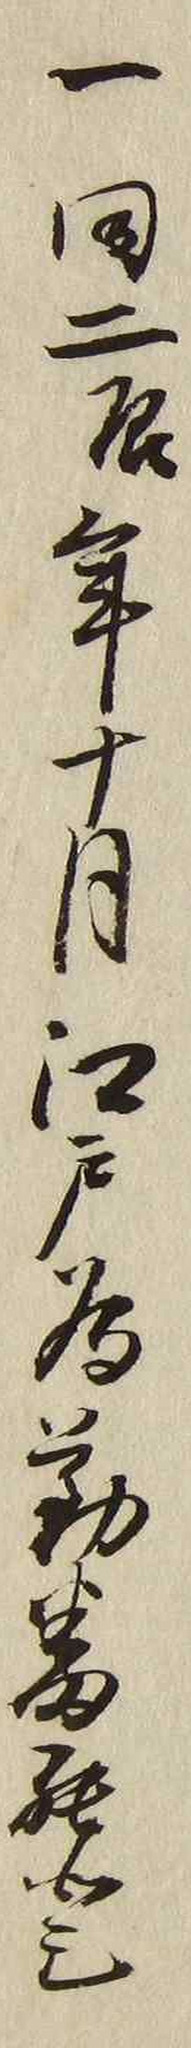一同二辰年十月江戸為勤番罷登

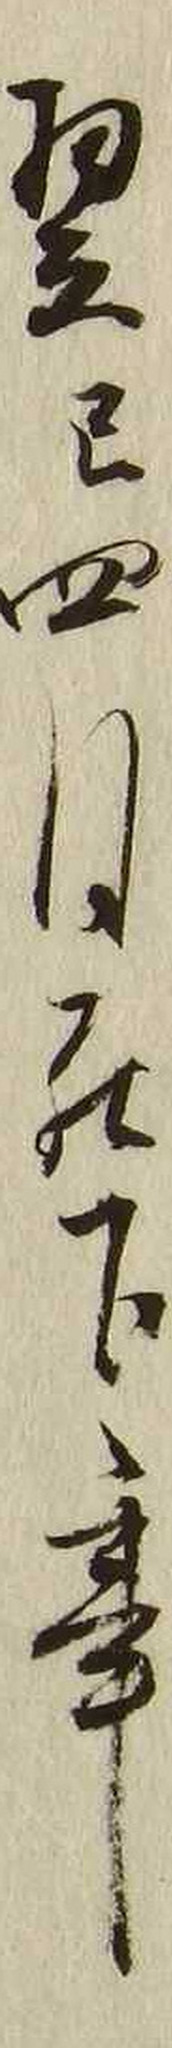翌巳四月罷下候事
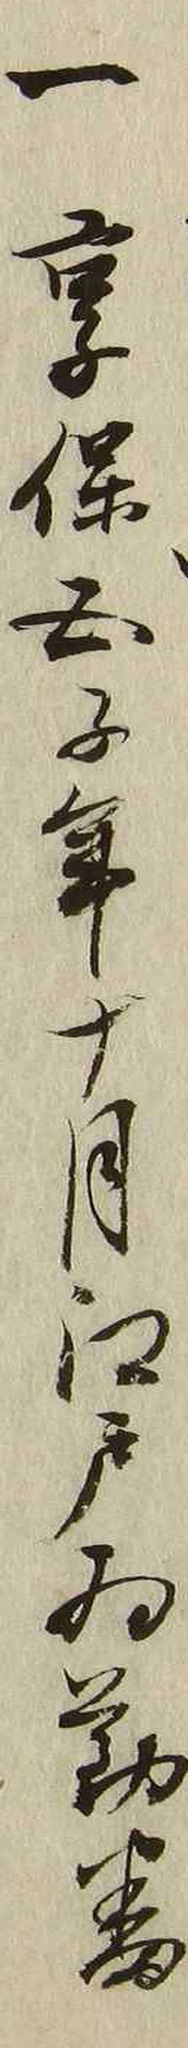一享保五子年十月江戸為勤番
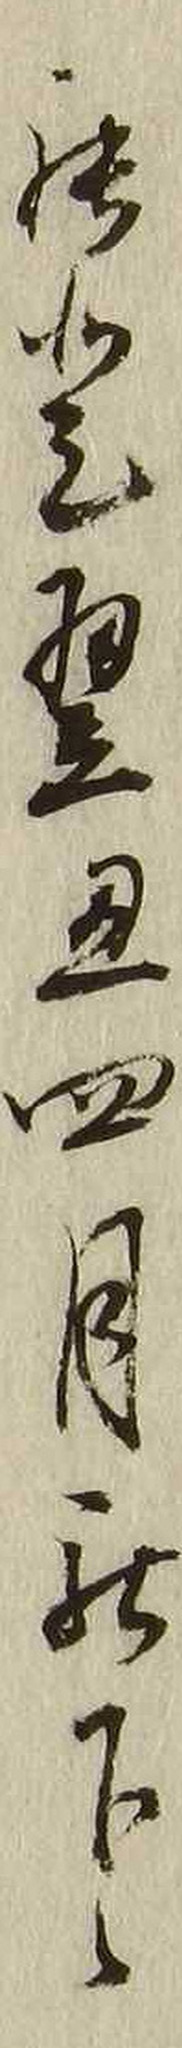罷登翌丑四月罷下候
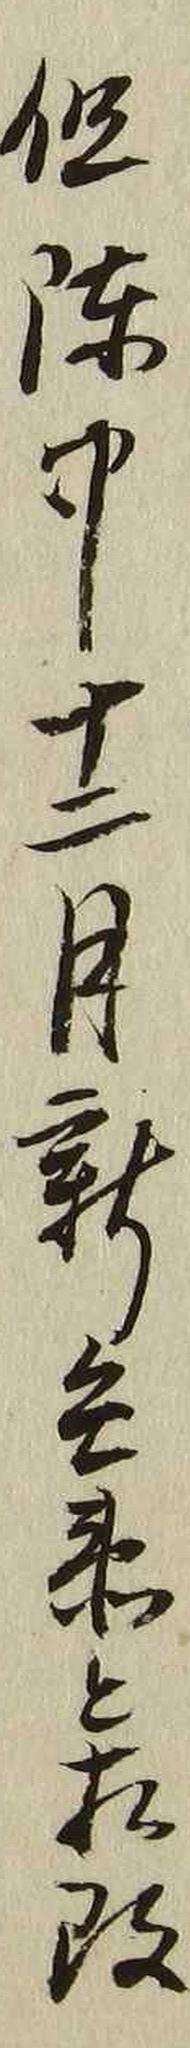但陣中十二月新兵衛と相改
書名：諸士系譜　巻之348　も之部4
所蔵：会津若松市立会津図書館
